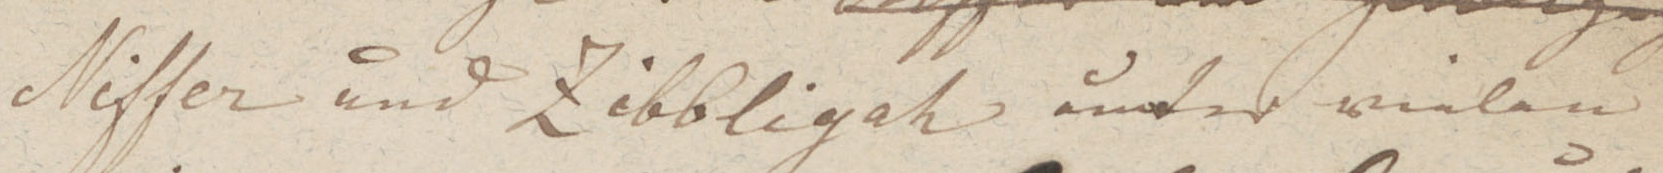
Niffer und Zibbliyah unter vielen
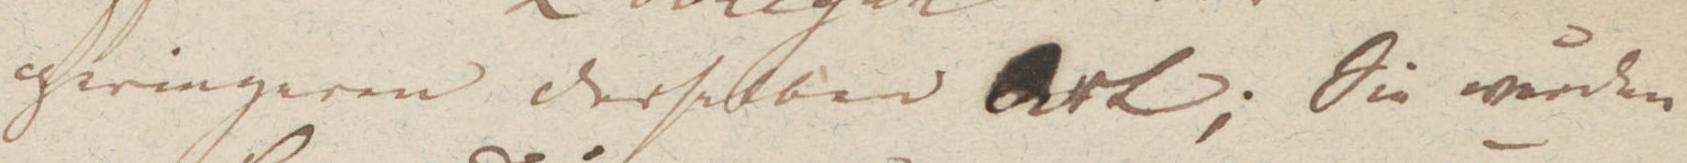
geringeren derselben Art; Sie wurden
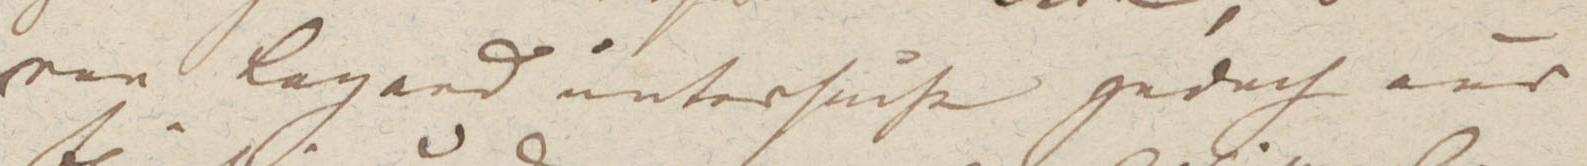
von Layard untersucht jedoch nur
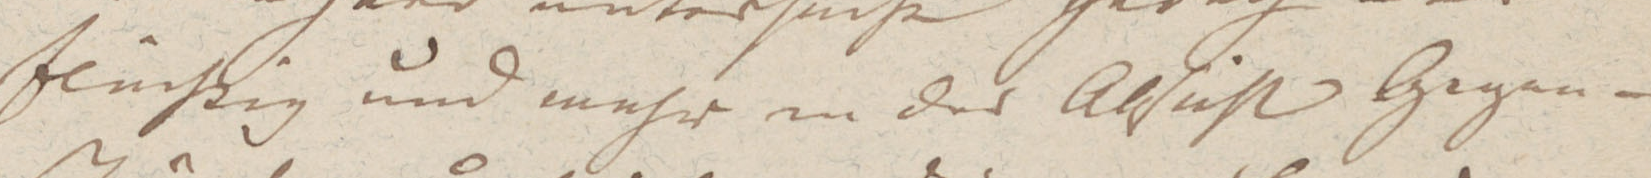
flüchtig und mehr in der Absicht Gegen-
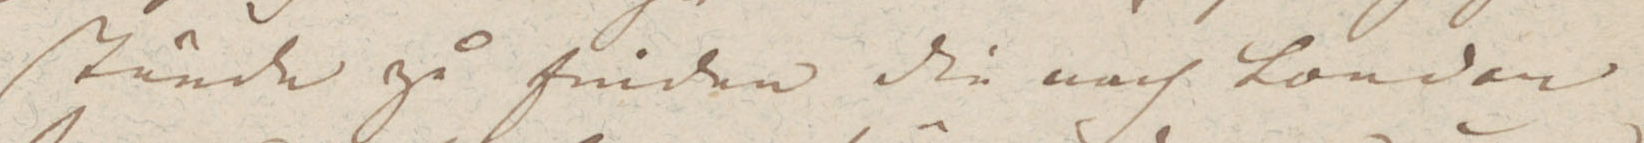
stände zu finden die nach London
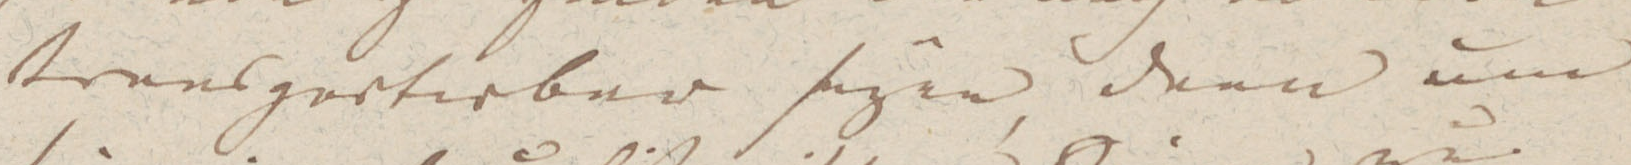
transportirbar seyen, denn um
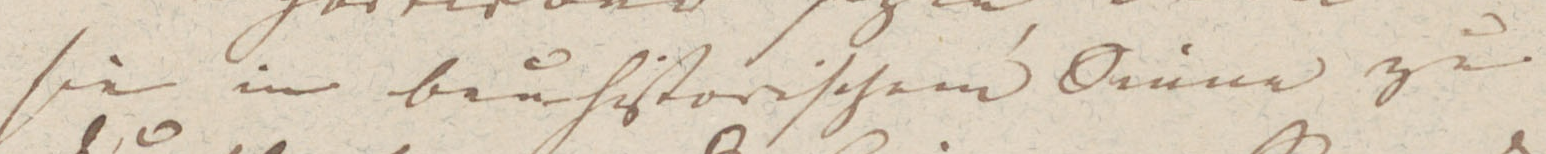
sie in bauhistorischem Sinne zu
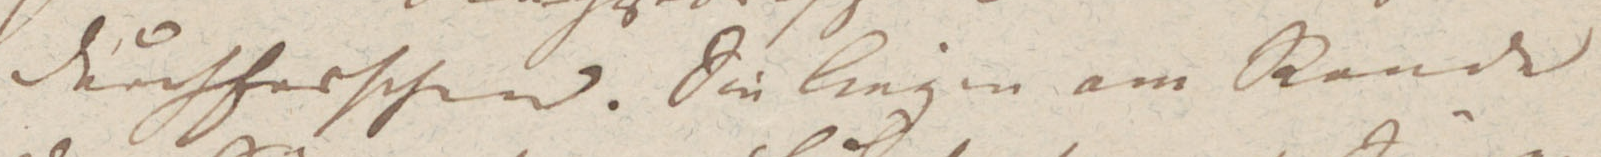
durchforschen. Sie liegen am Rande
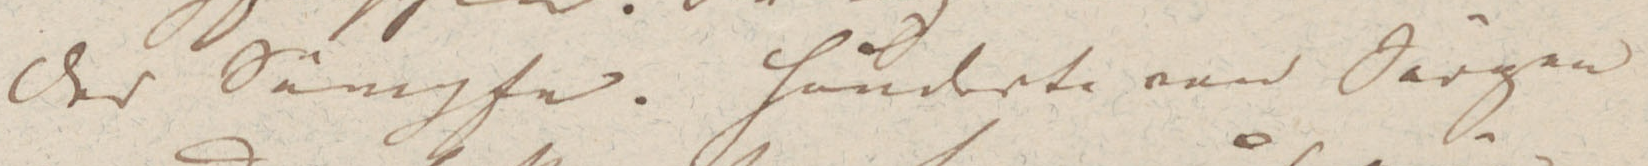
der Sümpfe. Hunderte von Särgen
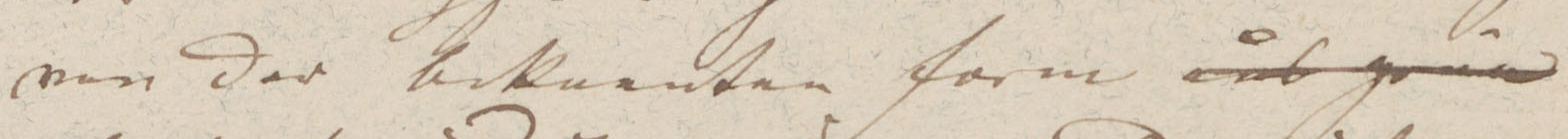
von der bekannten Form aus grün
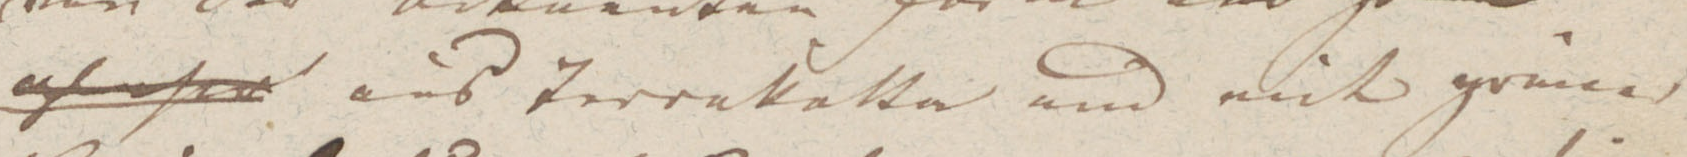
glasur aus Terrakotta und mit grüner
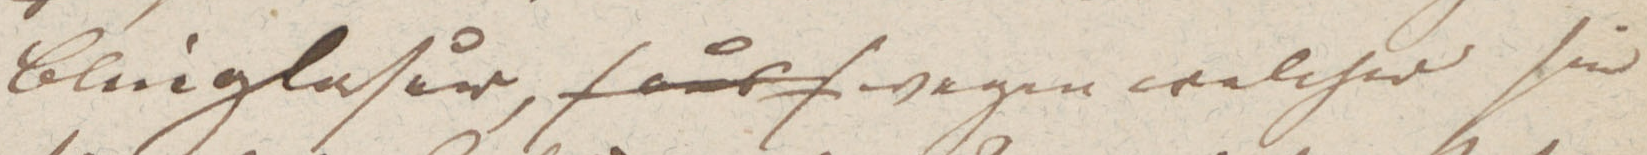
Bleiglasur, (aus ( wegen welcher sie
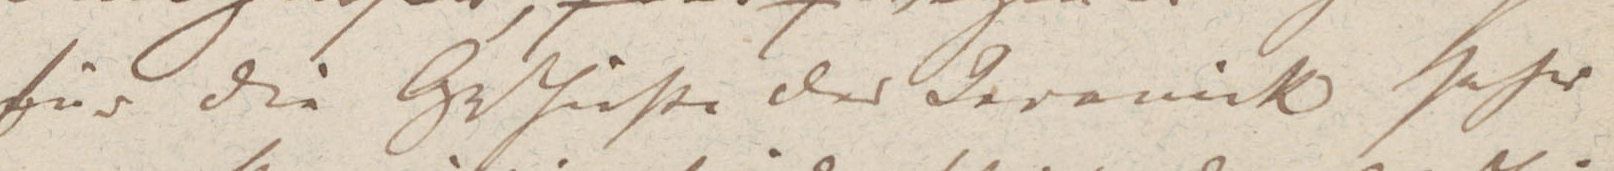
für die Geschichte der Keramik sehr
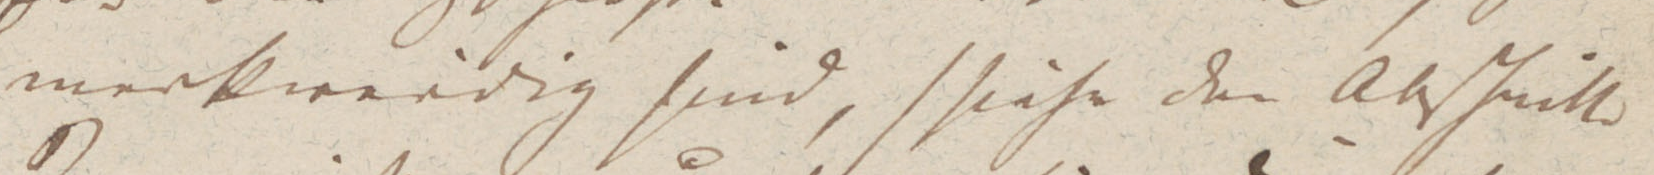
merkwürdig sind, (siehe den Abschnitt
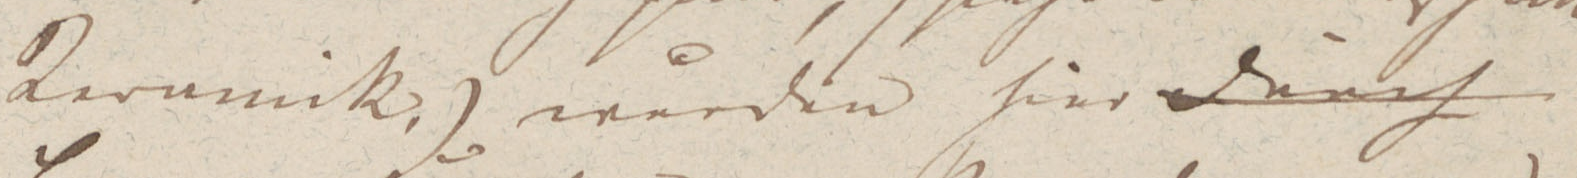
Keramik,) wurden hier durch
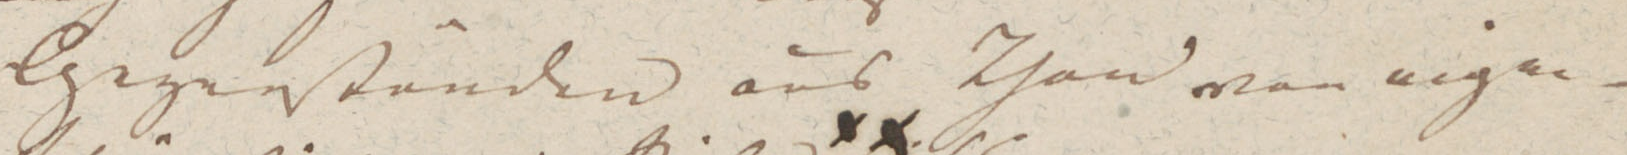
Gegenständen aus Thon von eigen-
